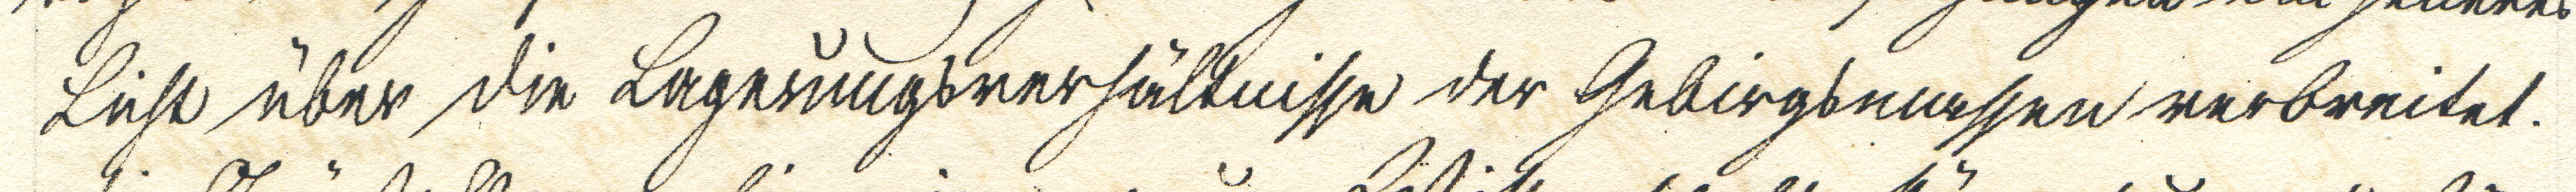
Licht über die Lagerungsverhältnisse der Gebirgsmassen verbreitet.
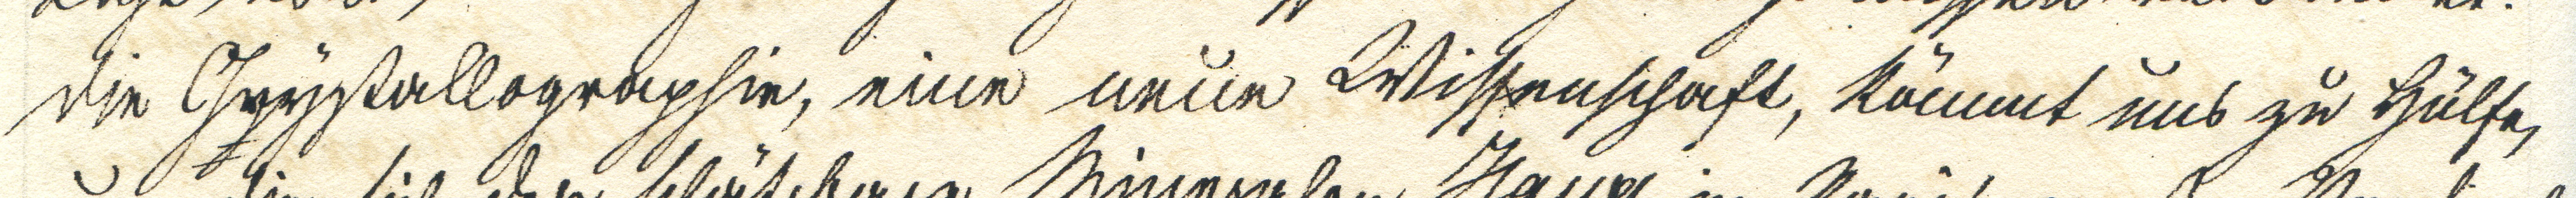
Die Chyrÿstallographie, eine neue Wissenschaft kömmt uns zu Hülfe,
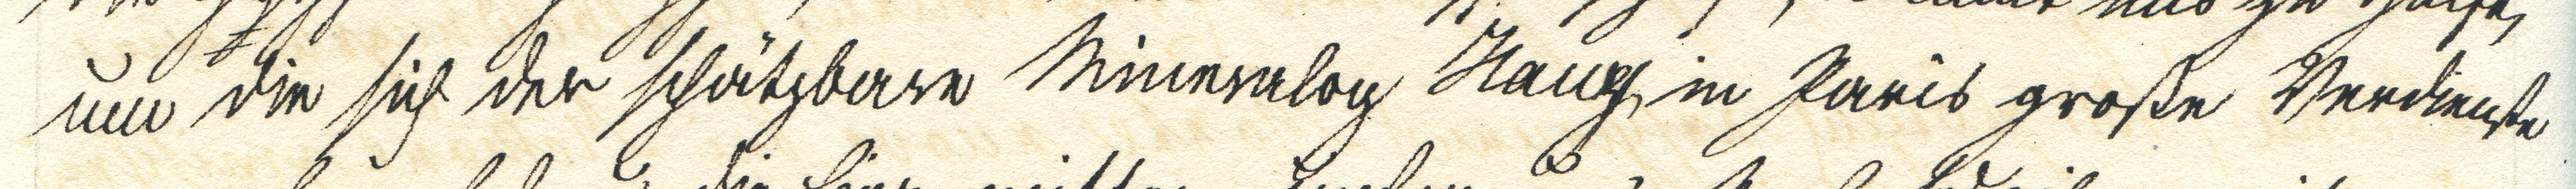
um die sich der schätzbare Mineralog Hauy in Paris große Verdienste
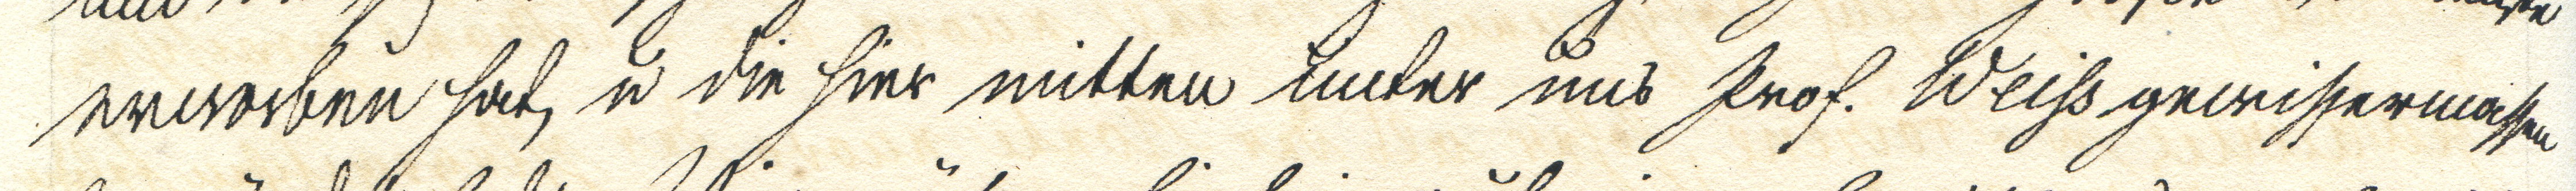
erworben hat, u die hier mitten unter uns Prof. Weiss gewissermassen
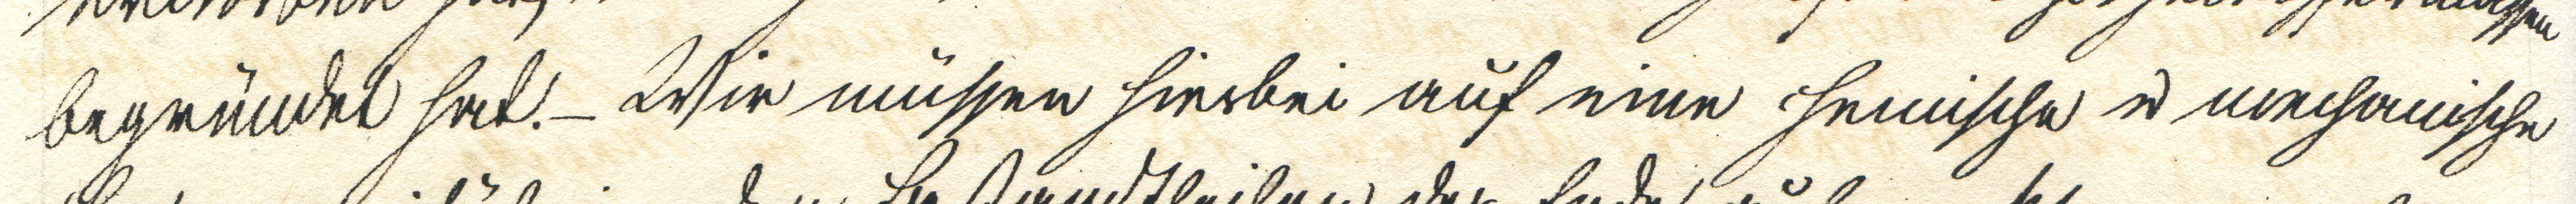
begründet hat. – Wir müssen hierbei auf eine chemische u mechanische
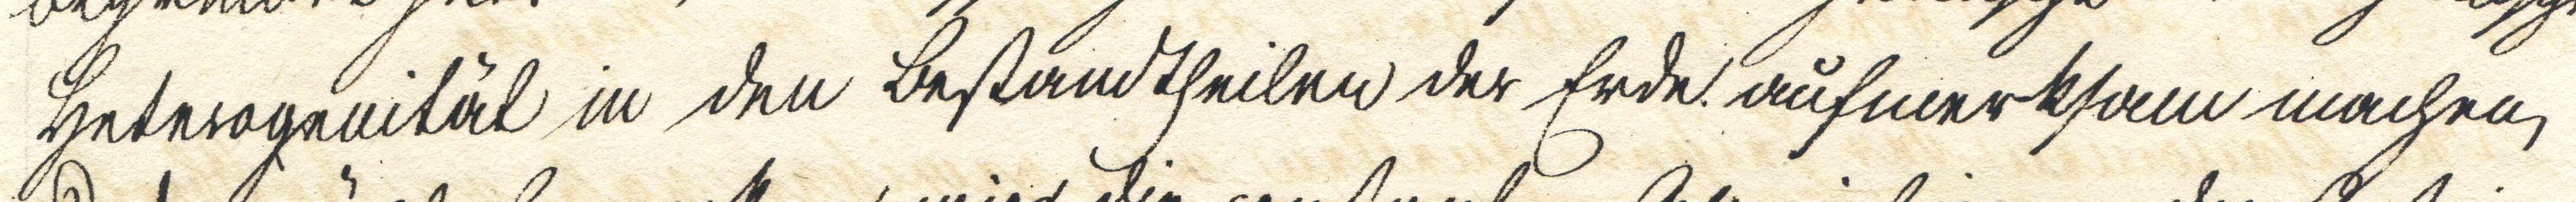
Heterogenität in den Bestandtheilen der Erde aufmerksam machen,
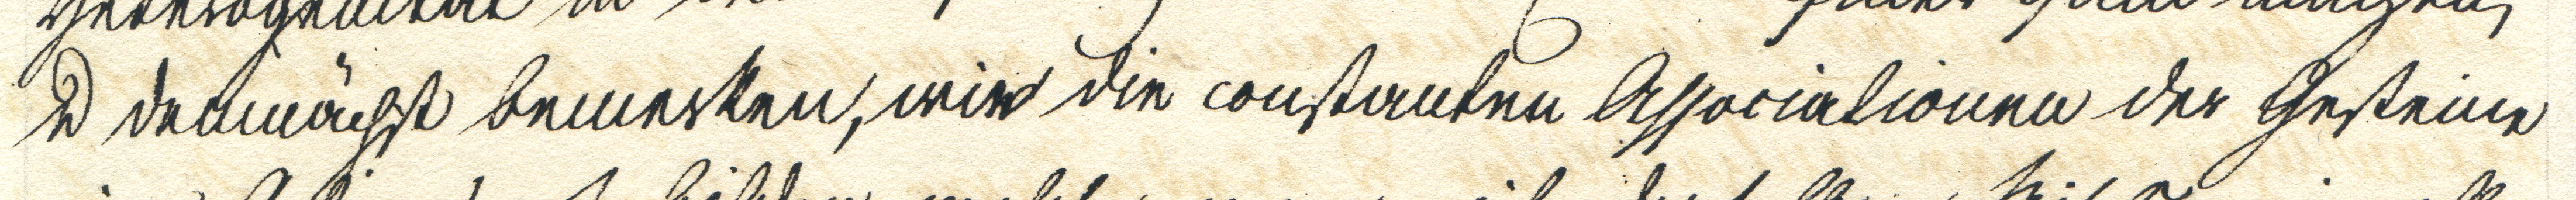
u demnächst bemerken, wie die constanten Associationen der Gesteine
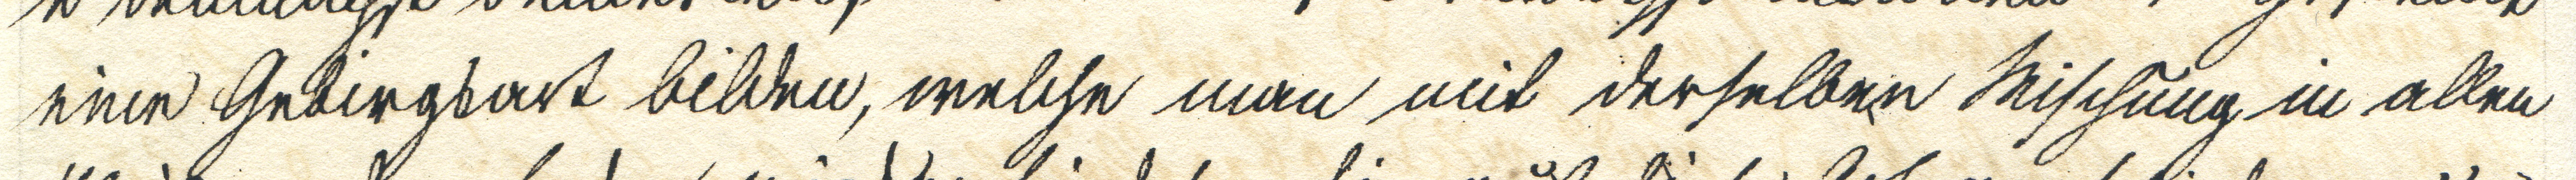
eine Gebirgsart bilden, welche man mit derselben Mischung in allen
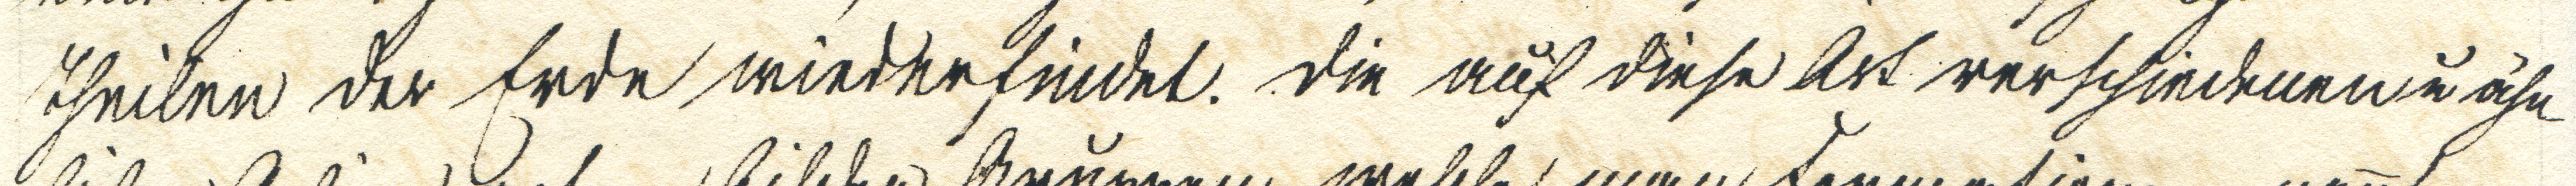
Theilen der Erde wiederfindet. Die auf diese Art verschiedenen u ähn-
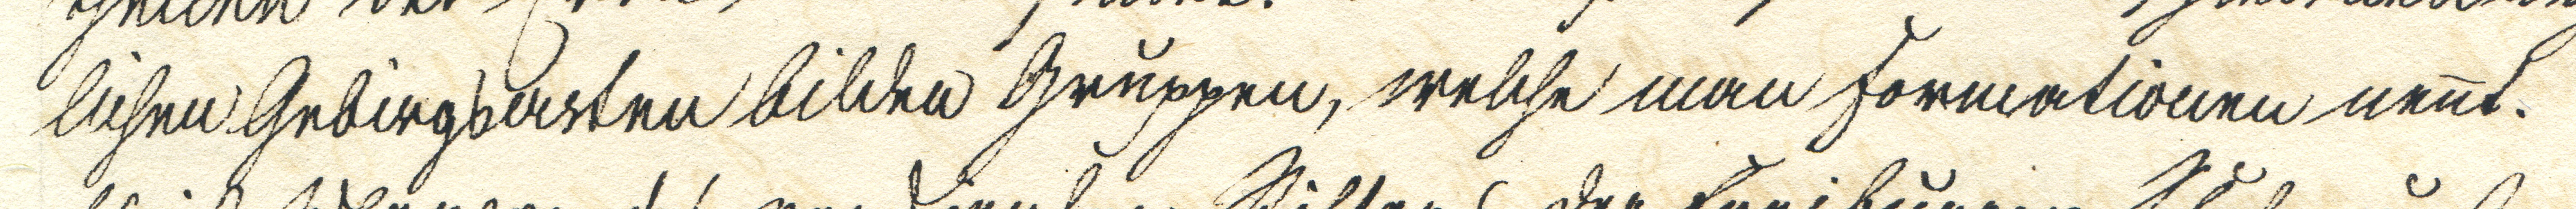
lichen Gebirgsarten bilden Gruppen, welche man Formationen neñt.
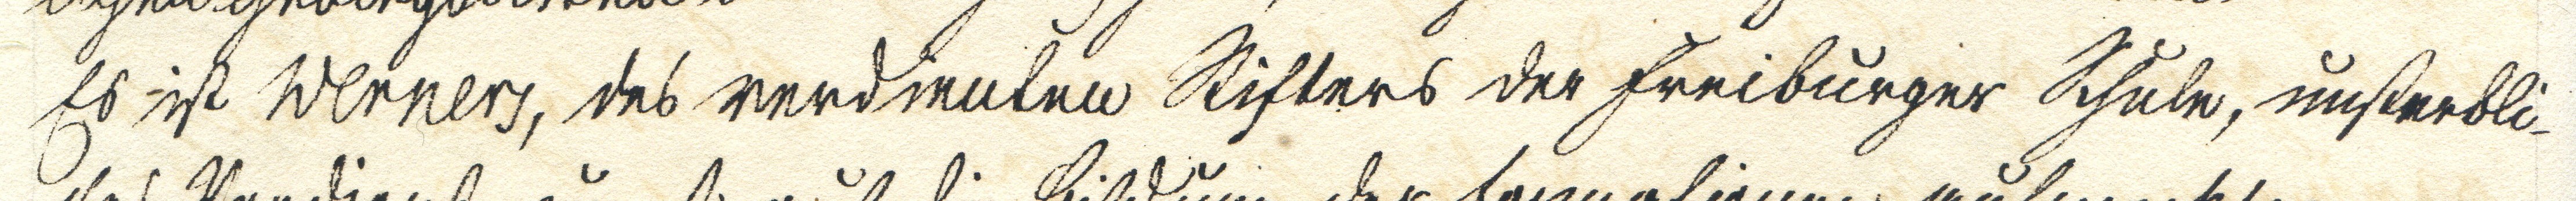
Es ist Werners, des verdienten Stifters der Freiburger Schule, unsterbli-
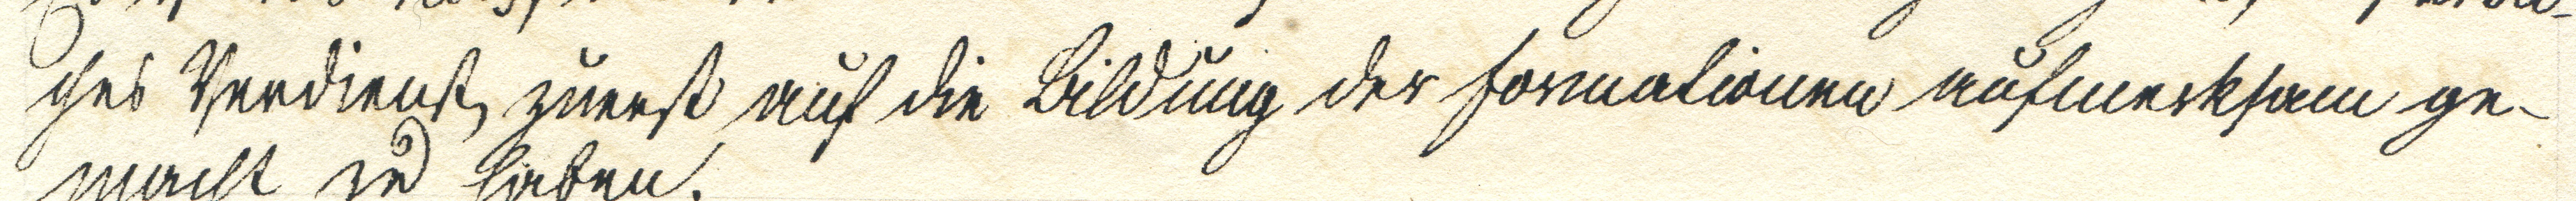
ches Verdienst, zuerst auf die Bildung der Formationen aufmerksam ge-
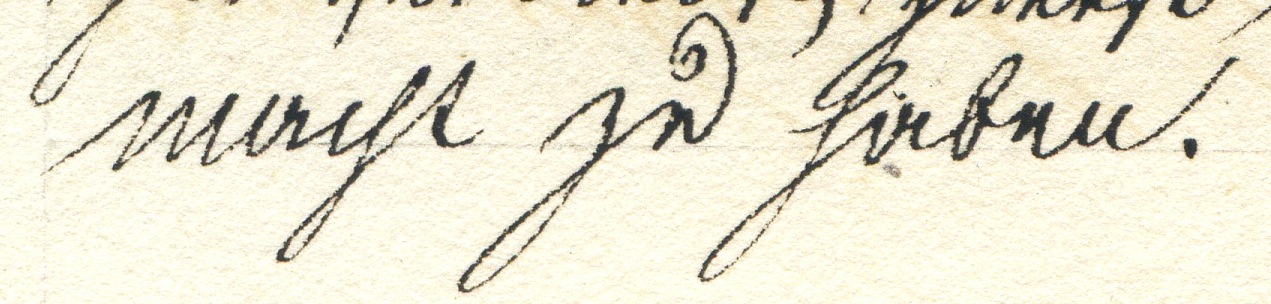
macht zu haben.
